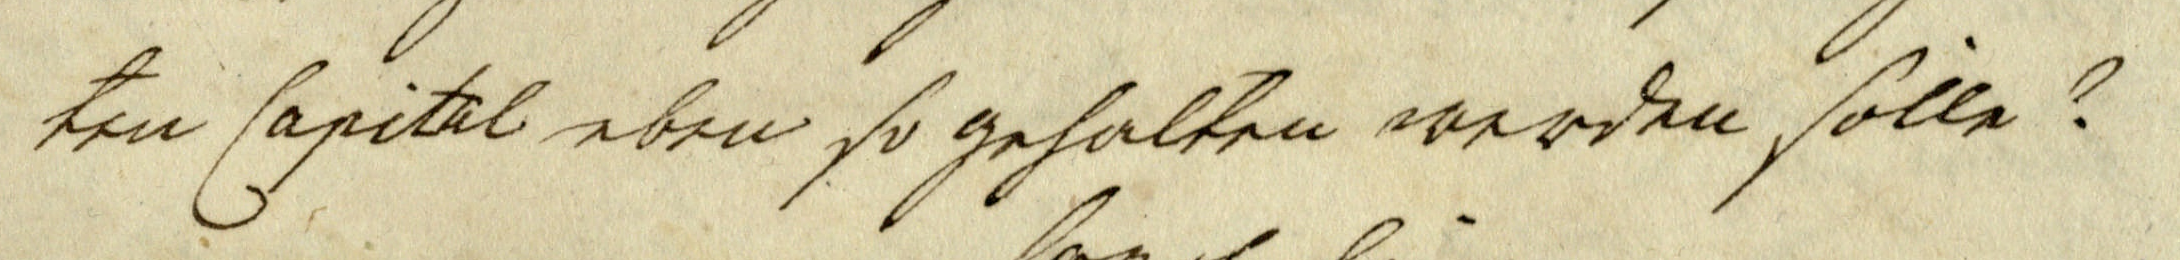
ten Capital eben so gehalten werden solle ?
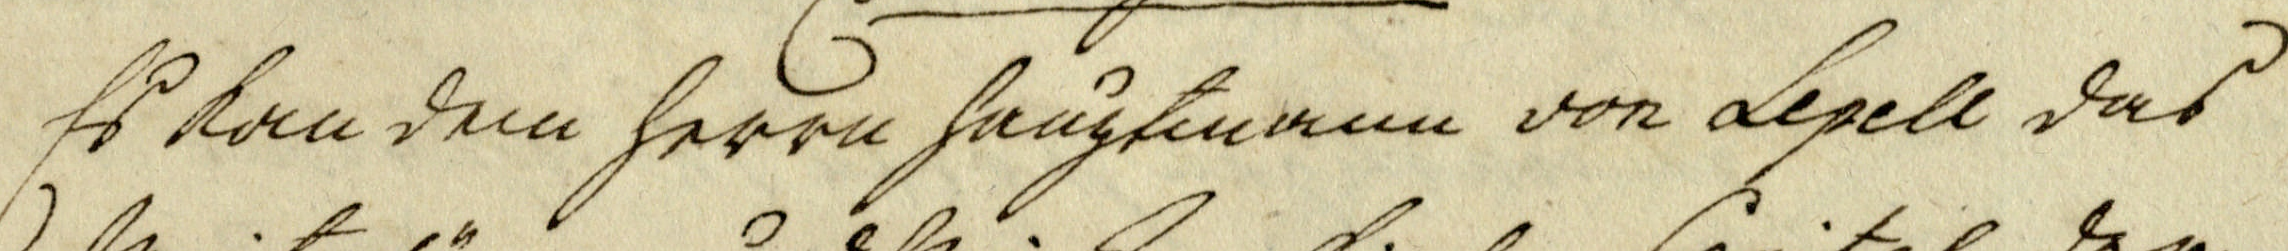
Es kan dem Herrn Hauptmann von Lepell das
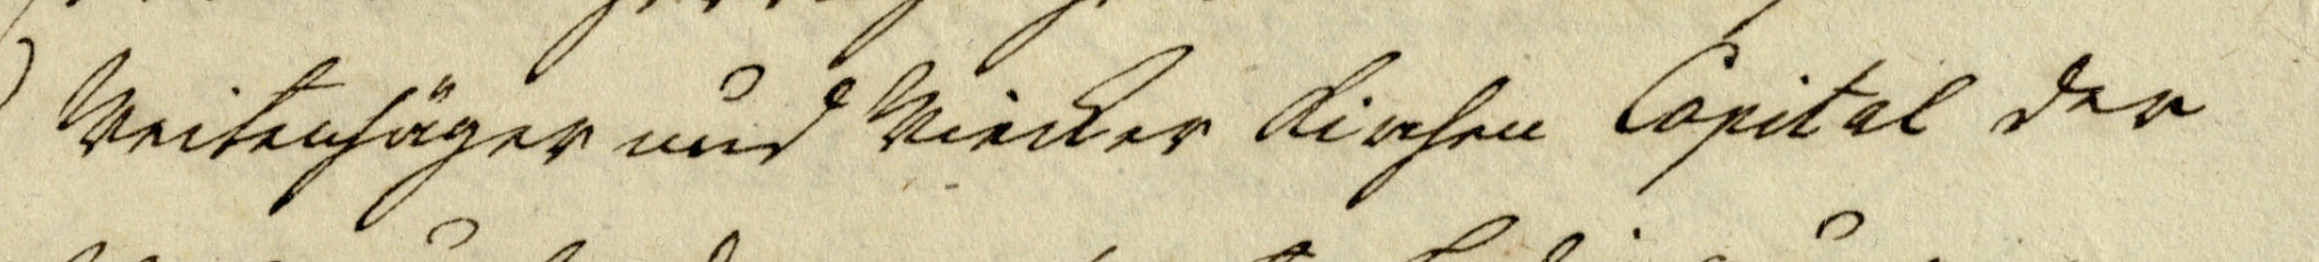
Weitenhäger und Wiecker Kirchen Capital der
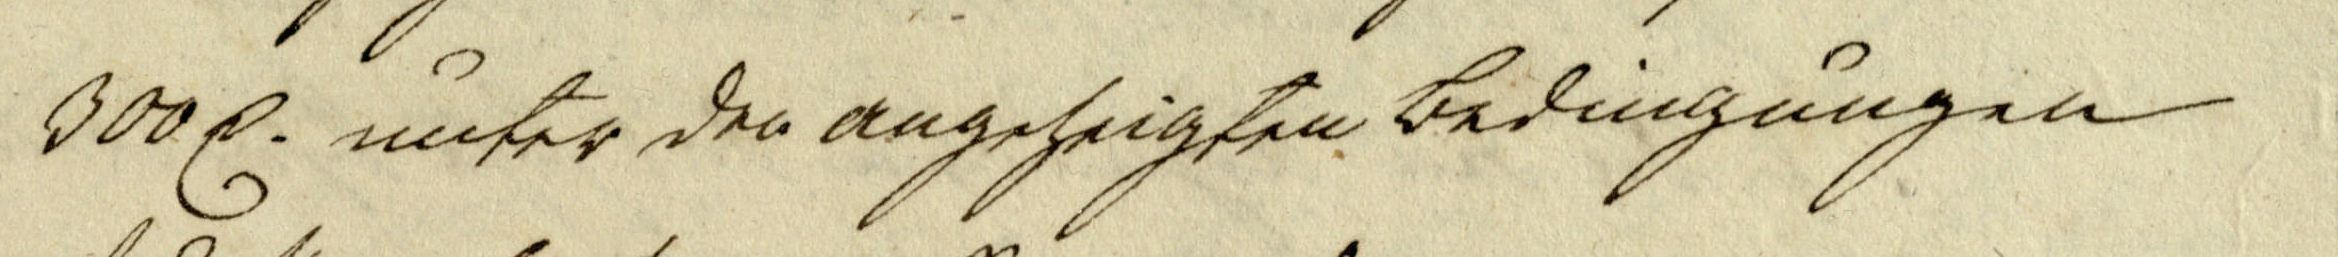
300 l. unter den angezeigten Bedingungen
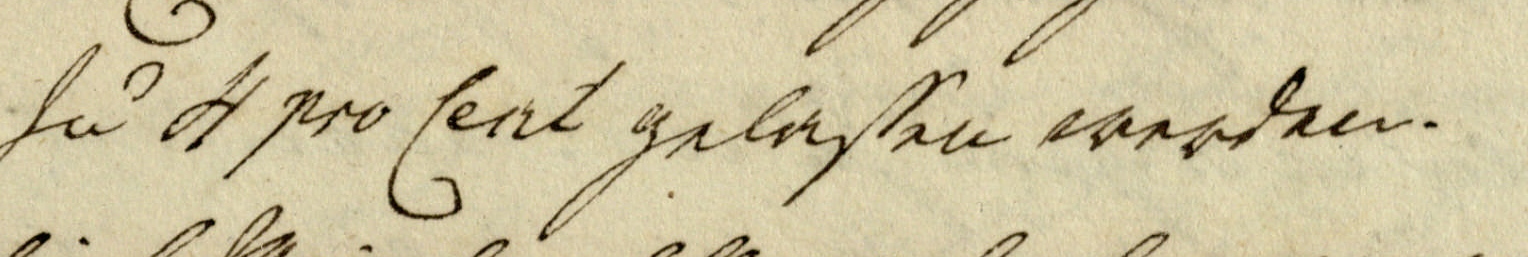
zu 4 pro Cent gelassen werden.
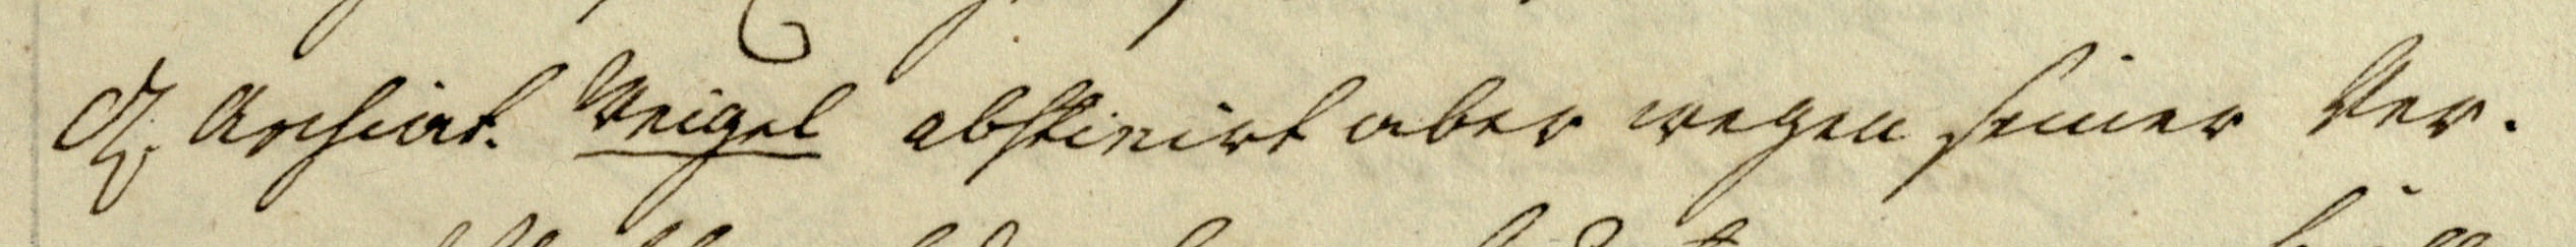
dh. Archiat. Weigel abstinirt aber wegen seiner Ver¬
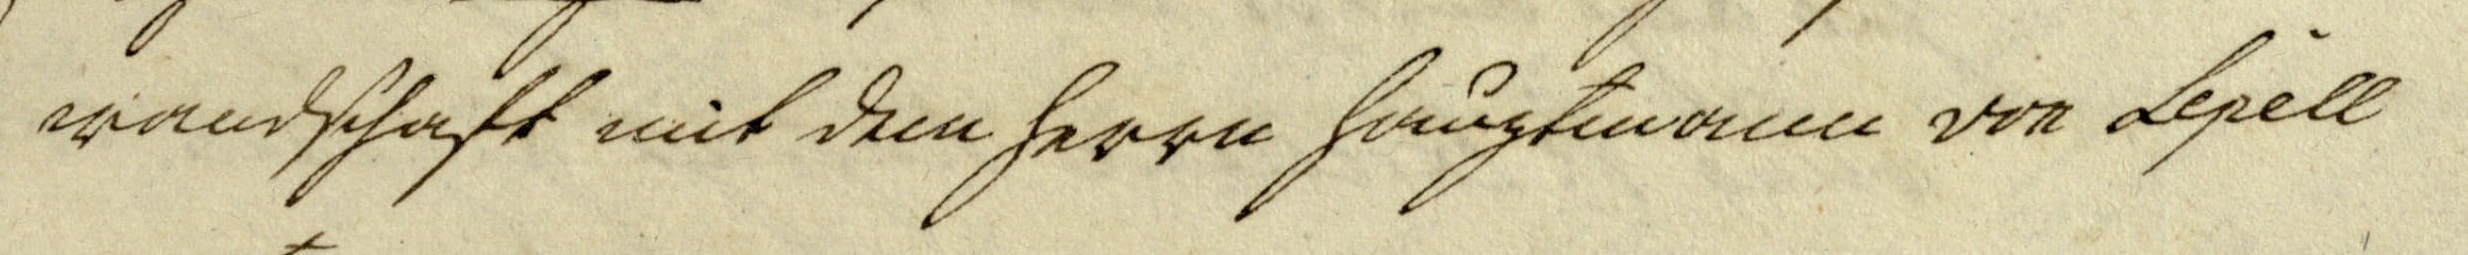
wandschaft mit dem Herrn Hauptmann von Lepell
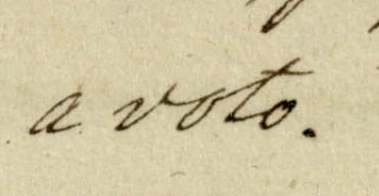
a voto.
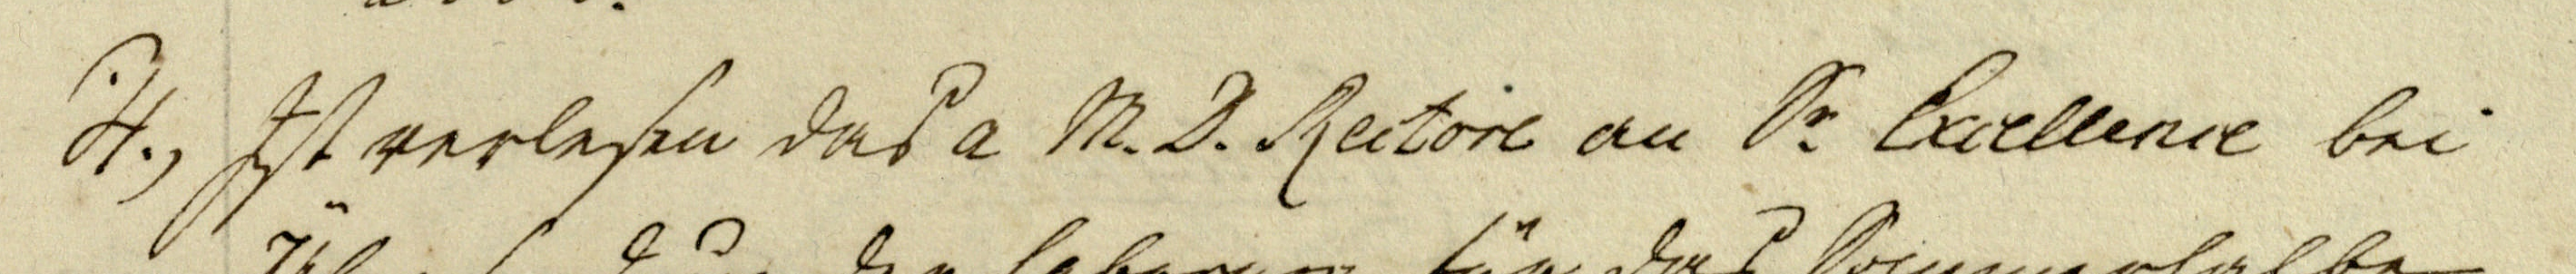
4., Ist verlesen das a M. D. Rectore an Sr Excellence bei
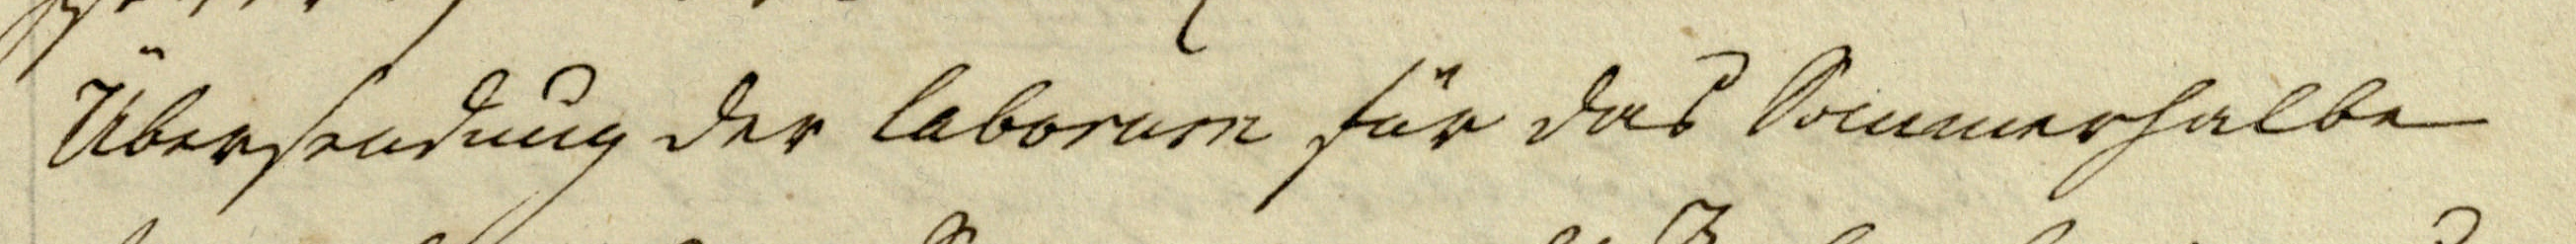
Übersendung der Laborum für das Sommerhalbe
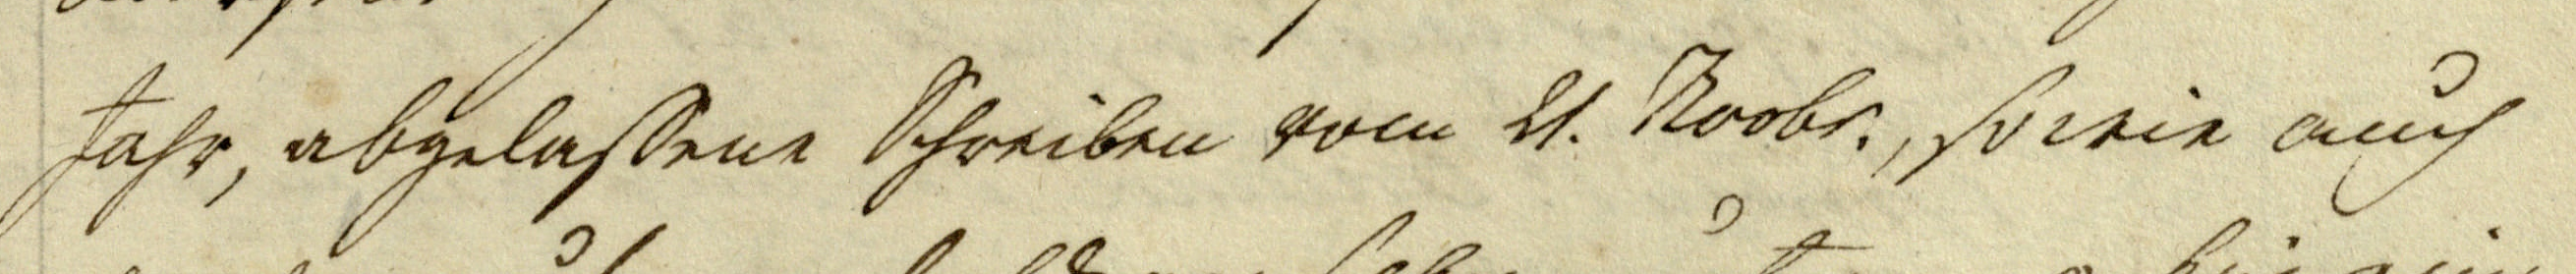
Jahr, abgelassene Schreiben vom 21. Novbr., so wie auch
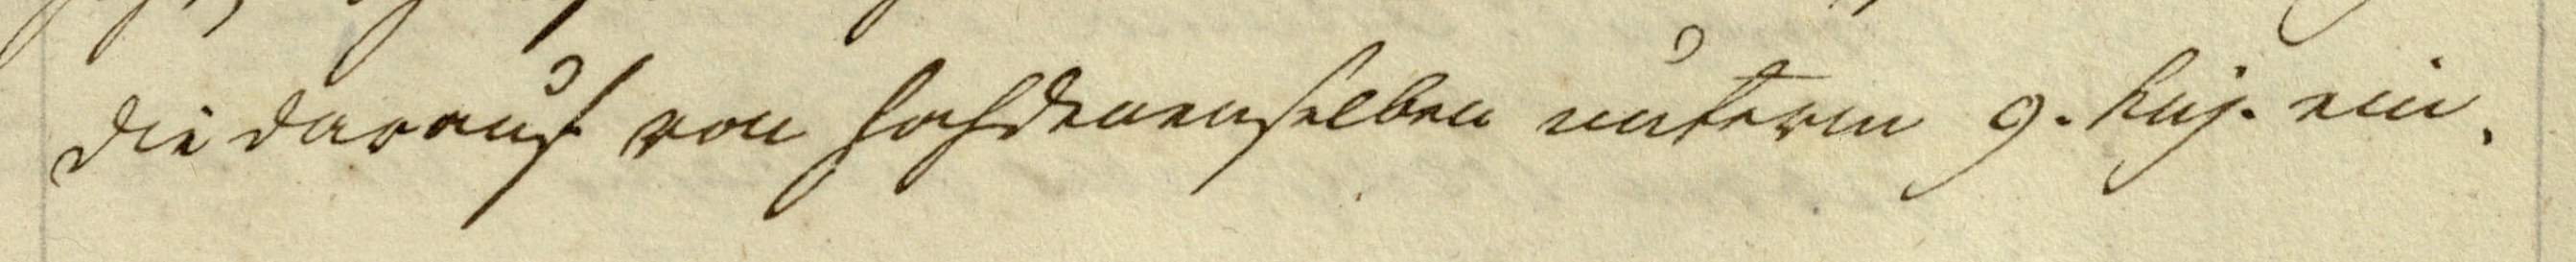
die darauf von hochdenenselben unterm 9. huj. ein¬
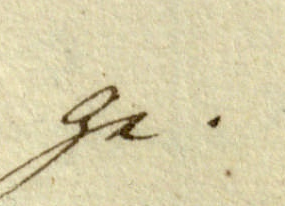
ge¬
